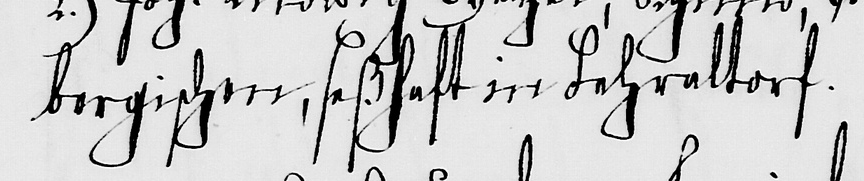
bergischen, seßhaft in Fehraltorf.
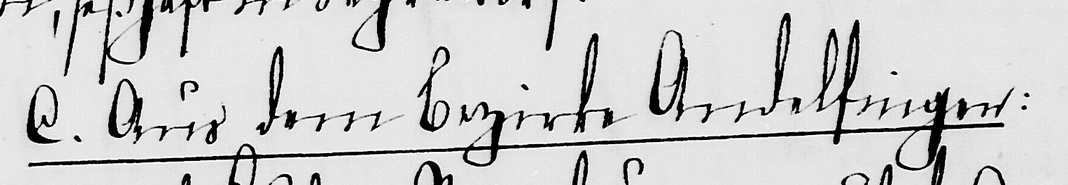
C. Aus dem Bezirke Andelfingen:
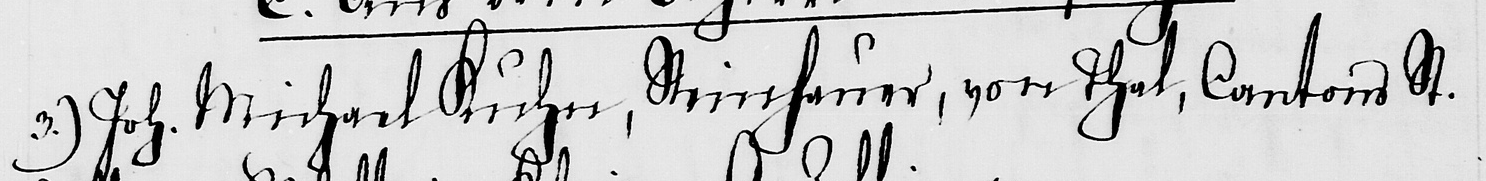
3.) Joh. Michael Kuhn, Steinhauer, von Thal, Cantons St.
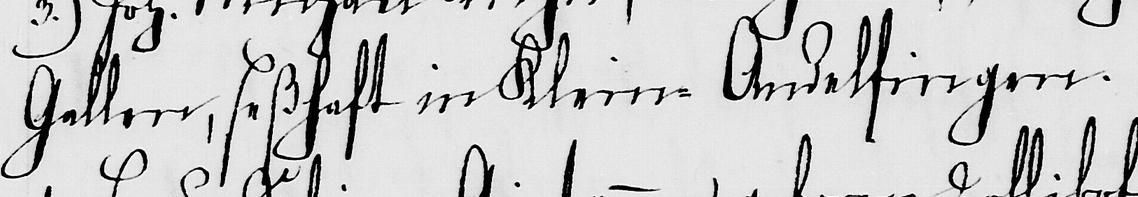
Gallen, seßhaft in Klein-Andelfingen.
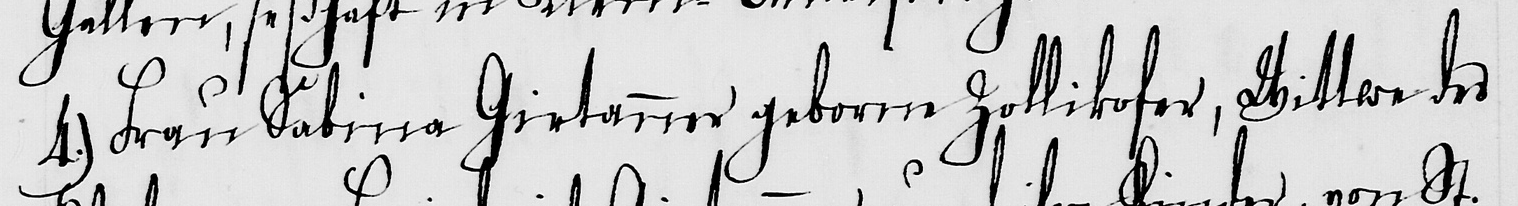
4.) Frau Sabina Girtanner geborne Zollikofer, Wittwe des
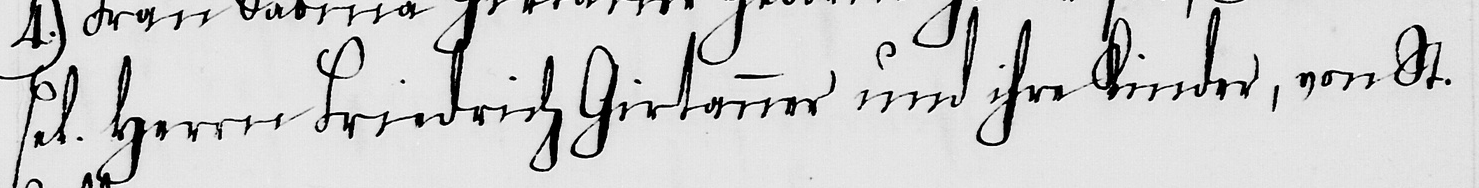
sel. Herrn Friedrich Girtanner und ihre Kinder, von St.
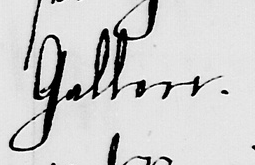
Gallen.
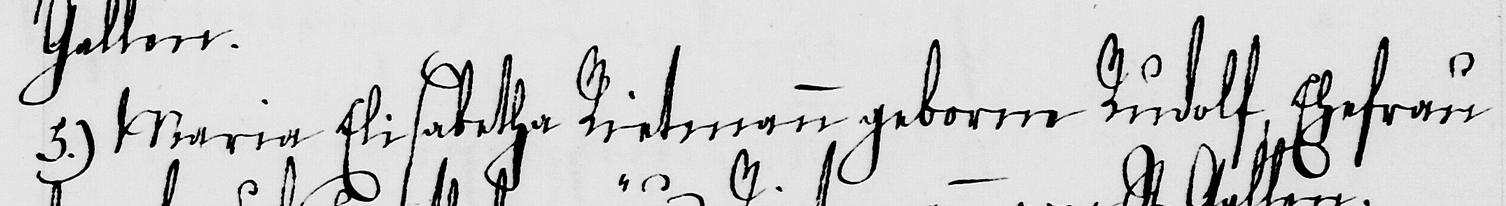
5.) Maria Elisabetha Rietmann geborne Rudolf, Ehefrau
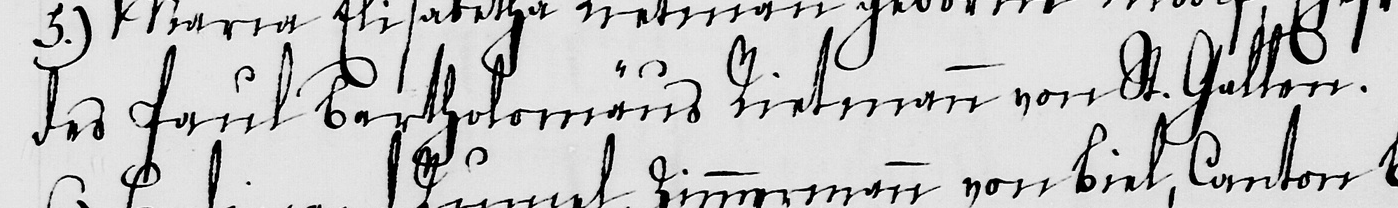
des Paul Bartholomäus Rietmann von St. Gallen.
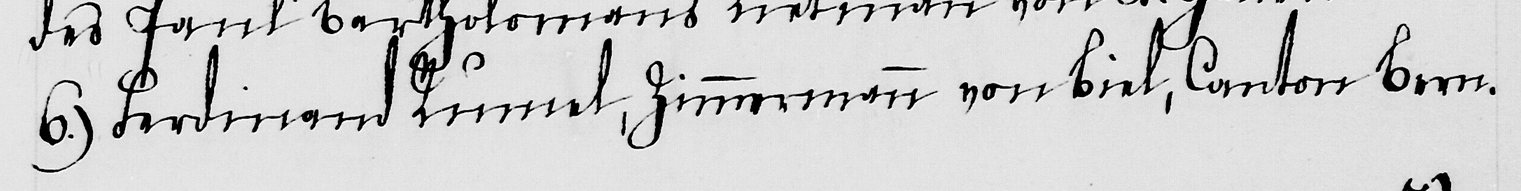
6.) Ferdinand Rumel, Zimmermann von Biel, Canton Bern.
